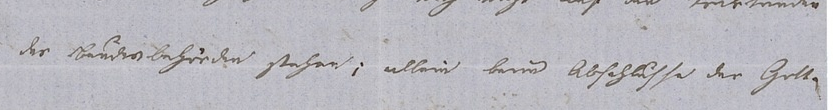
der Bundesbehörden stehen; allein beim Abschlusse der Gott-
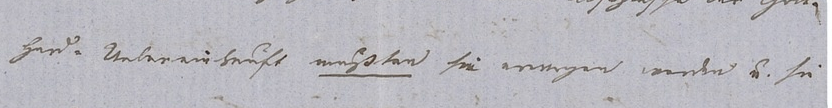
hard-Uebereinkunft mußten sie erwogen werden u. sie
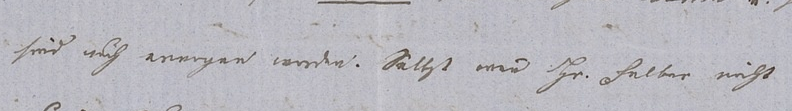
sind auch erwogen worden. Selbst wenn Hr. Felber nicht
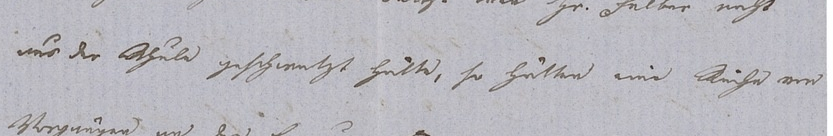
aus der Schule geschwatzt hätte, so hätten eine Reihe von
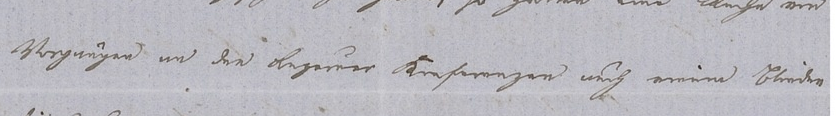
Vorgängen an den Luzerner Konferenzen auch einem Blinden
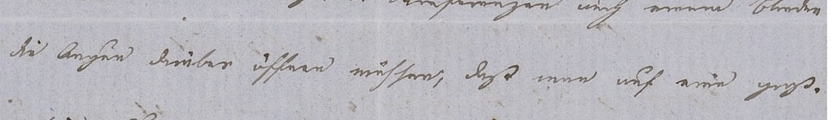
die Augen darüber öffnen müssen, daß man auf eine groß-
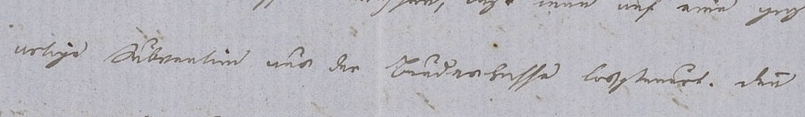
artige Subvention aus der Bundeskasse lossteuert. Denn
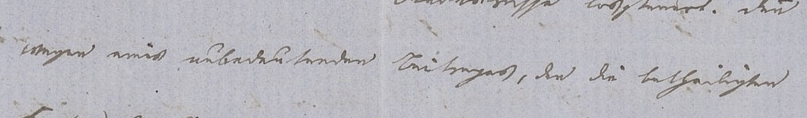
wegen eines unbedeutenden Beitrages, den die betheiligten
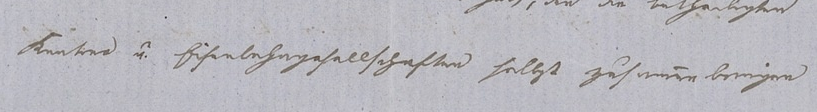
Kantone u. Eisenbahngesellschaften selbst zusammenbringen
